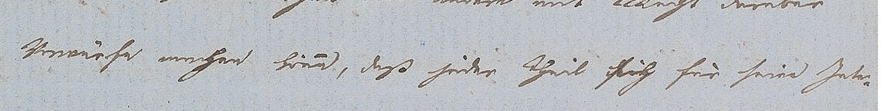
Vorwürfe machen kann, daß jeder Theil sich für seine Inte-
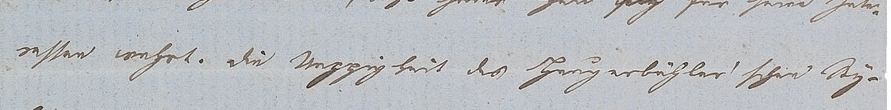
ressen wehrt. Die Ueppigkeit des Hungerbühler'schen Sty-
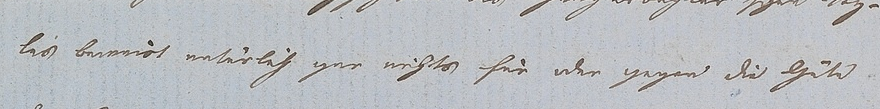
les beweist natürlich gar nichts für oder gegen die Güte
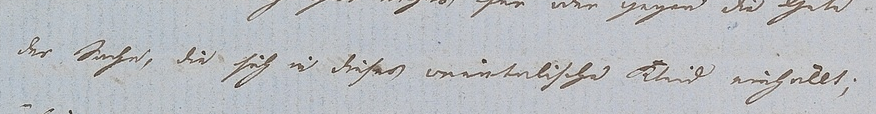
der Sache, die sich in dieses lisches Kleid einhüllt;
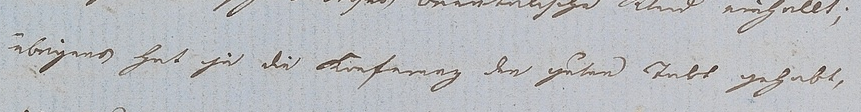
übrigens hat ja die Konferenz den guten Takt gehabt,
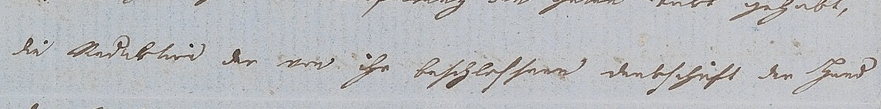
die Redaktion der von ihr beschlossnen Denkschrift der Hand
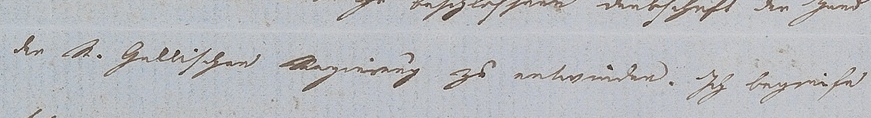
der St. Gallischen Regierung zu entwinden. Ich begreife
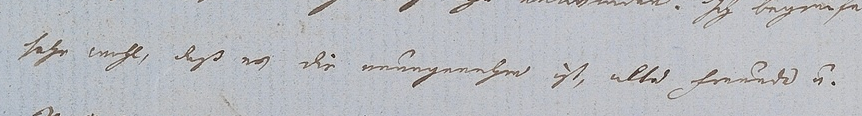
sehr wohl, daß es Dir unangenehm ist, alte Freunde u.
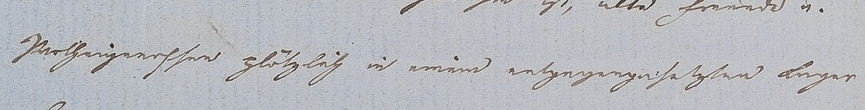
Partheigenossen plötzlich in einem entgegengesetzten Lager
